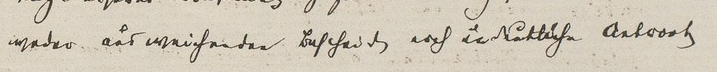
weder ausweichenden Bescheid noch ausdrückliche Antwort
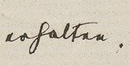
erhalten.
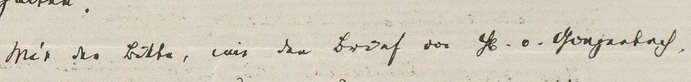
Mit der Bitte, mir den Brief von H. v. Gonzenbach,
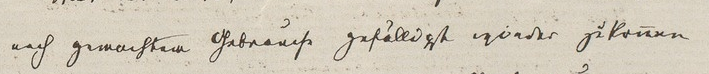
nach gemachtem Gebrauche gefälligst wieder zukommen
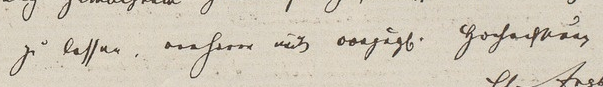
zu lassen, verharre mit vorzügl. Hochachtung
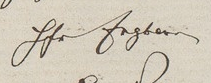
Ihr Ergbener
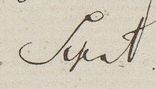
Schenk.
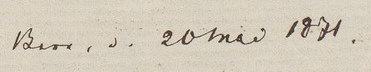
Bern, d. 20 Mai 1871.
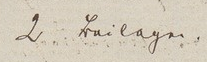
2 Beilagen.
